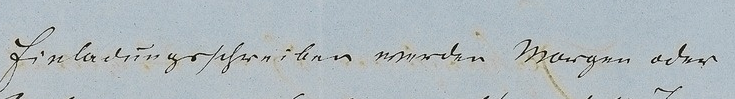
Einladungsschreiben werden Morgen oder
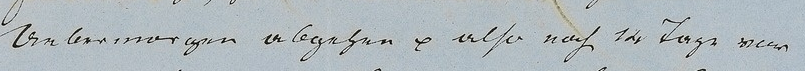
Uebermorgen abgehen & also noch 14 Tage vor
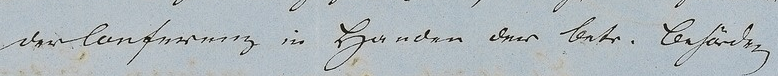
der Conferenz in Handen der betr. Behörden
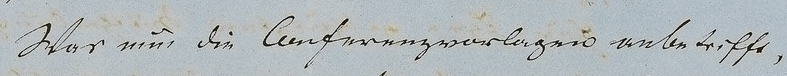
Was nun die Conferenzvorlagen anbetrifft,
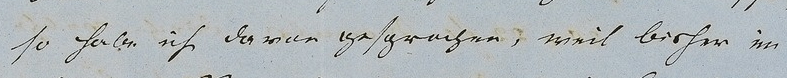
so habe ich davon gesprochen, weil bisher im
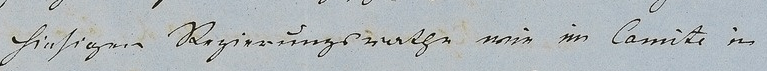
hiesigen Regierungsrathe wie im Comite in
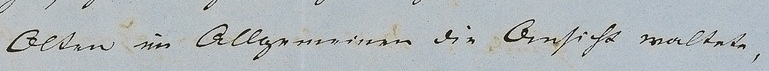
Olten im Allgemeinen die Ansicht waltete,
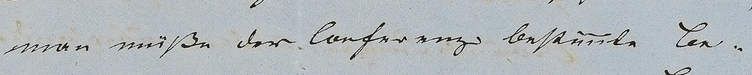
man müße der Conferenz bestimmte Be-
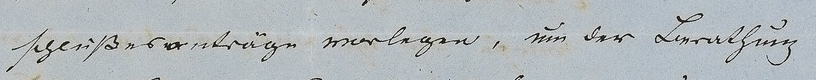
schlußesanträge vorlegen, um der Berathung
